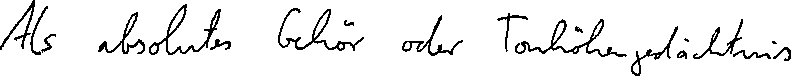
Als absolutes Gehör oder Tonhöhengedächtnis
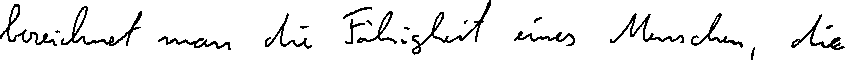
bezeichnet man die Fähigkeit eines Menschen, die
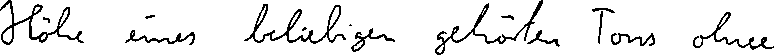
Höhe eines beliebigen gehörten Tons ohne
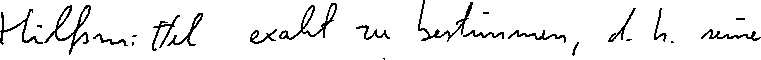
Hilfsmittel exakt zu bestimmen, d. h. seine
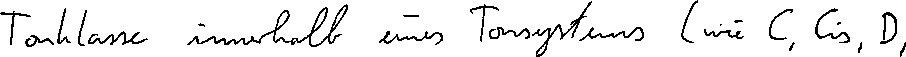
Tonklasse innerhalb eines Tonsystems (wie C, Cis, D,
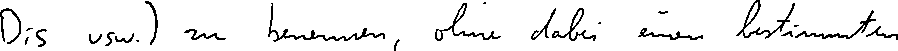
Dis usw.) zu benennen, ohne dabei einen bestimmten
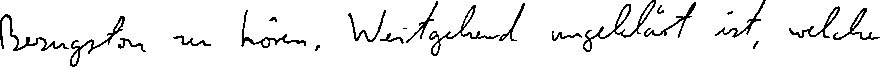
Bezugston zu hören. Weitgehend ungeklärt ist, welche
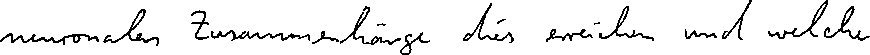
neuronalen Zusammenhänge dies erreichen und welche
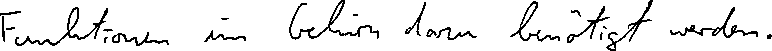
Funktionen im Gehirn dazu benötigt werden.
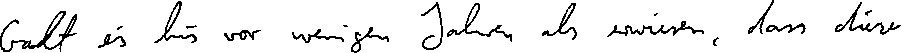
Galt es bis vor wenigen Jahren als erwiesen, dass diese
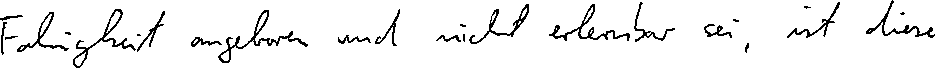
Fähigkeit angeboren und nicht erlernbar sei, ist diese
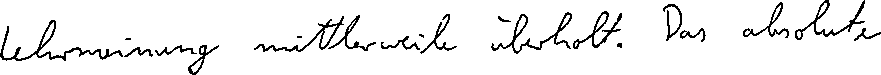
Lehrmeinung mittlerweile überholt. Das absolute
